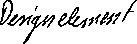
Designelement
